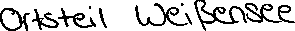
Ortsteil Weißensee
